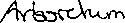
Arboretum
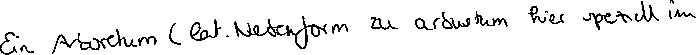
Ein Arboretum (lat. Nebenform zu arbustum hier speziell im
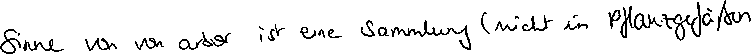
Sinne von von arbor ist eine Sammlung (nicht in Pflanzgefäßen
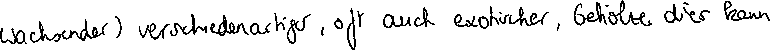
wachsender) verschiedenartiger, oft auch exotischer, Gehölze; dies kann
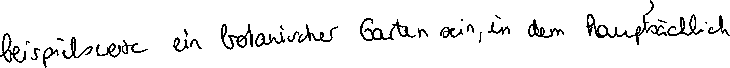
beispielsweise ein botanischer Garten sein, in dem hauptsächlich
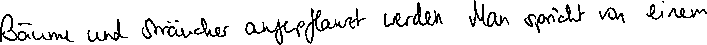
Bäume und Sträucher angepflanzt werden. Man spricht von einem
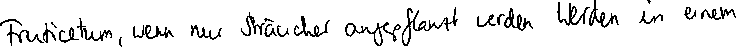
Fruticetum, wenn nur Sträucher angepflanzt werden. Werden in einem
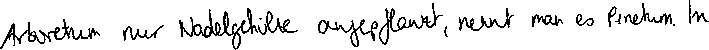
Arboretum nur Nadelgehölze angepflanzt, nennt man es Pinetum. In
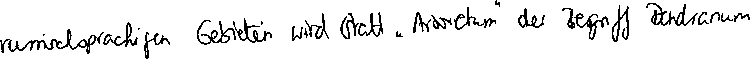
russischsprachigen Gebieten wird statt "Arboretum" der Begriff Dendrarium
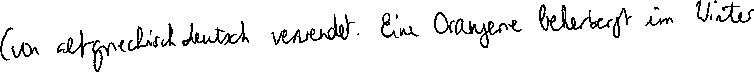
(von altgriechisch deutsch verwendet. Eine Orangerie beherbergt im Winter
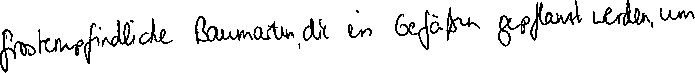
frostempfindliche Baumarten, die in Gefäßen gepflanzt werden, um
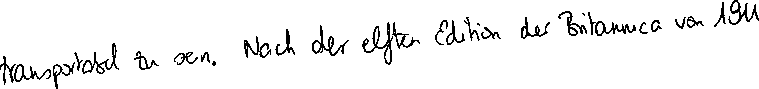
transportabel zu sein. Nach der elften Edition der Britannica von 1911
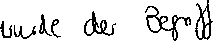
wurde der Begriff
